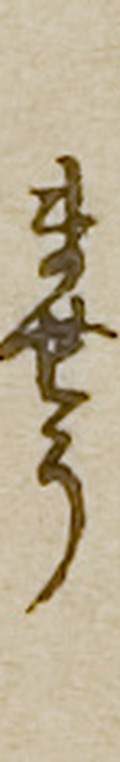ませう
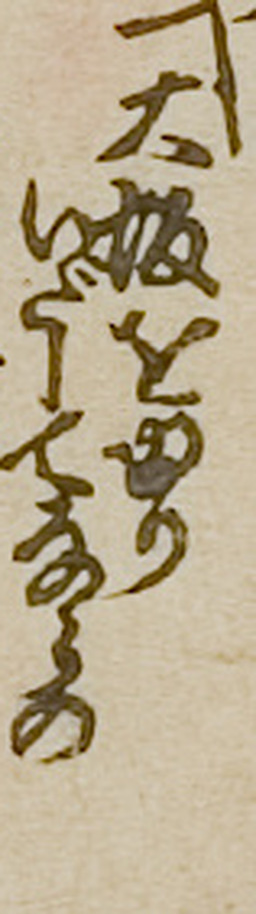いだしてならの
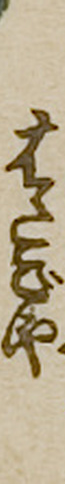はたごや
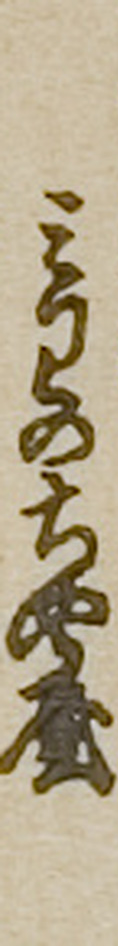みわのちや屋
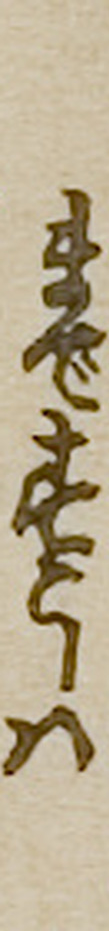まですこしは
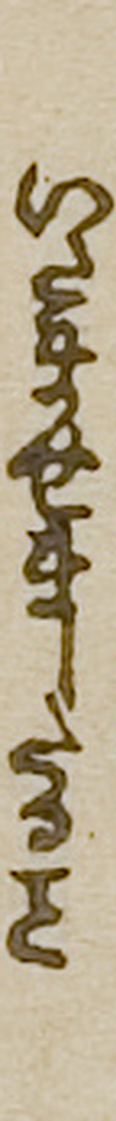いたませましたること
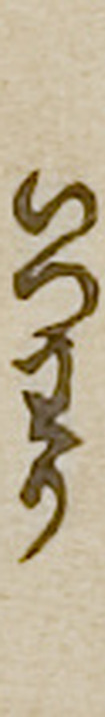いつわり
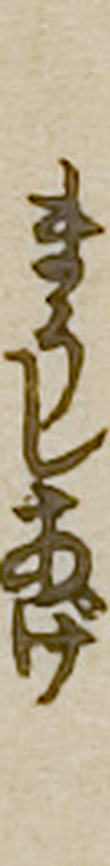まうしあげ
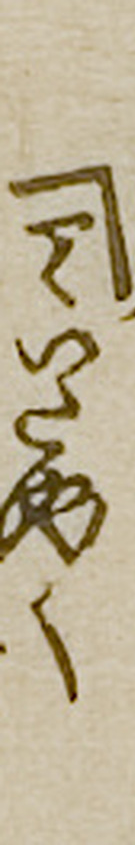「あゝいたや〳〵
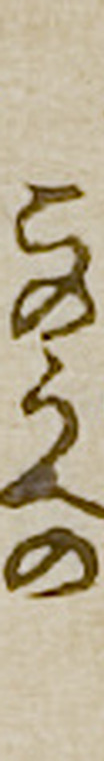このうへの
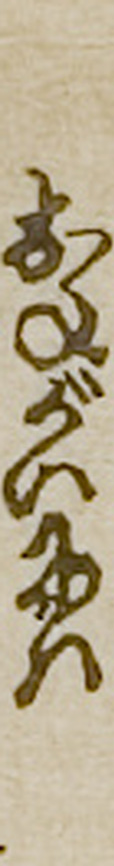おねがいには
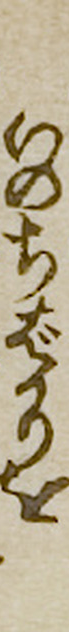いのちばかりを
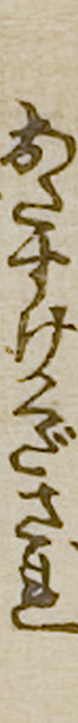おたすけくだされ
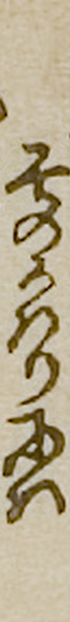そのかわりには
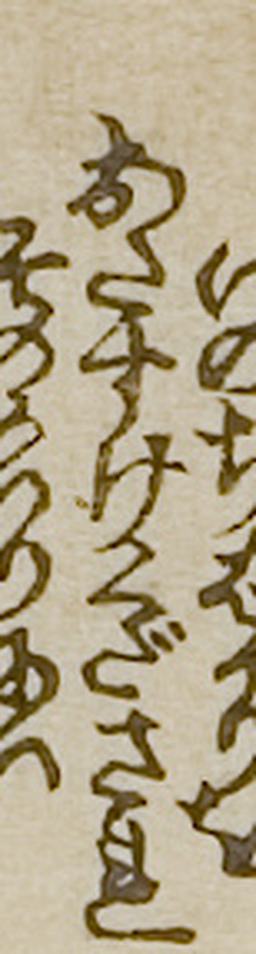そのかわりには
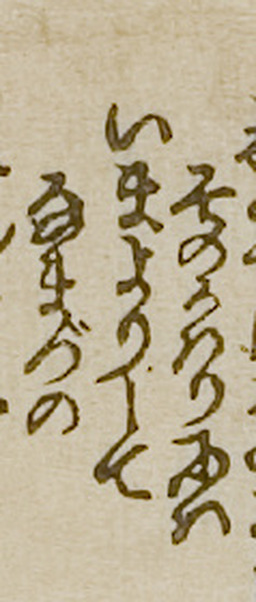いまよりして
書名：[地震鯰の取り調べ]
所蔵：東京大学総合図書館 General Library in the University of Tokyo, JAPAN
